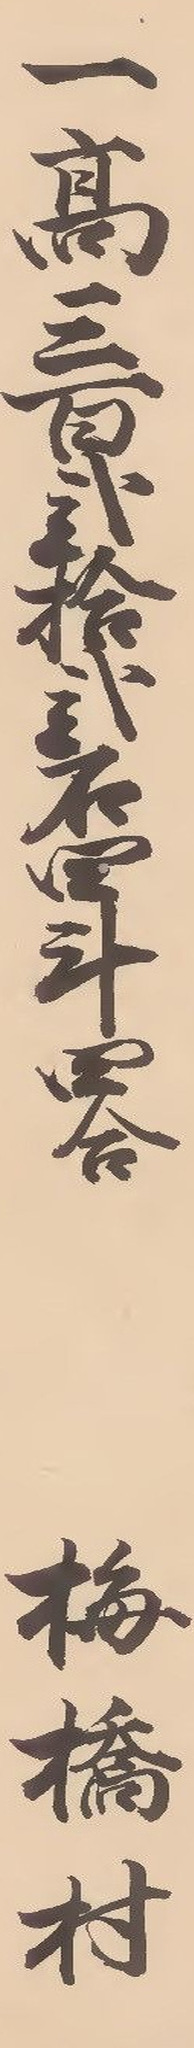一高三百弐拾弐石四斗四合梅橋村
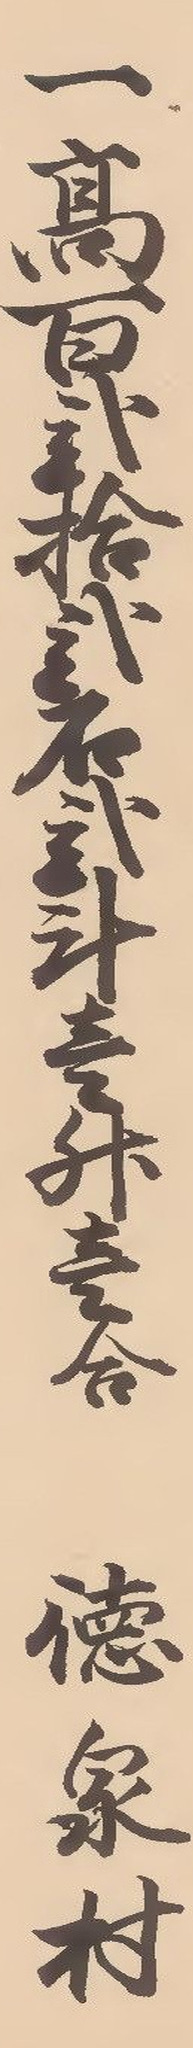一高百弐拾弐石弐斗壱升壱合徳泉村

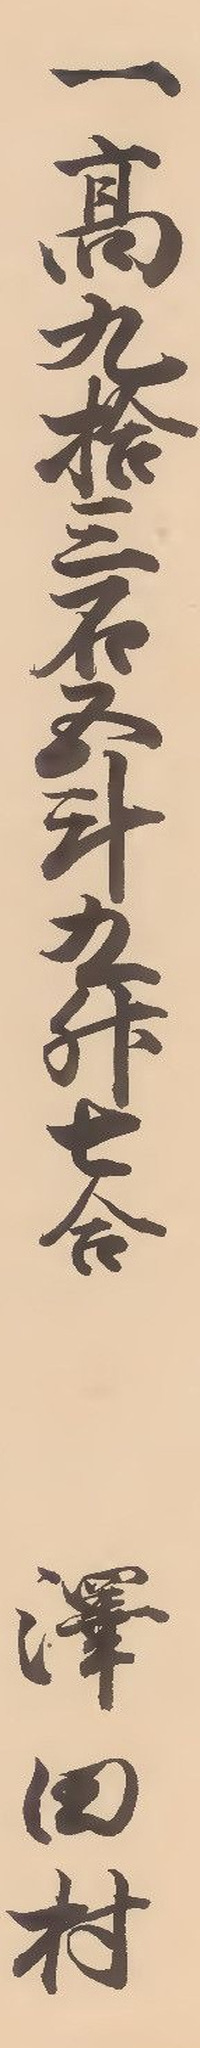一高九拾三石五斗九升七合沢田村
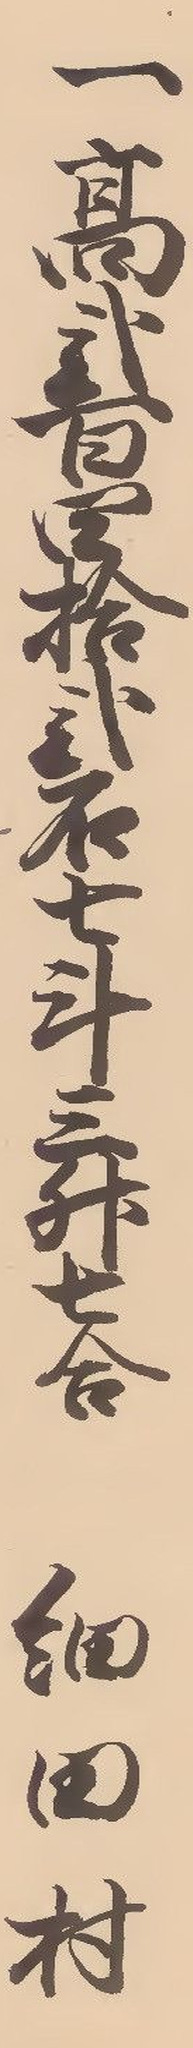一高弐百四拾弐石七斗三升七合細田村
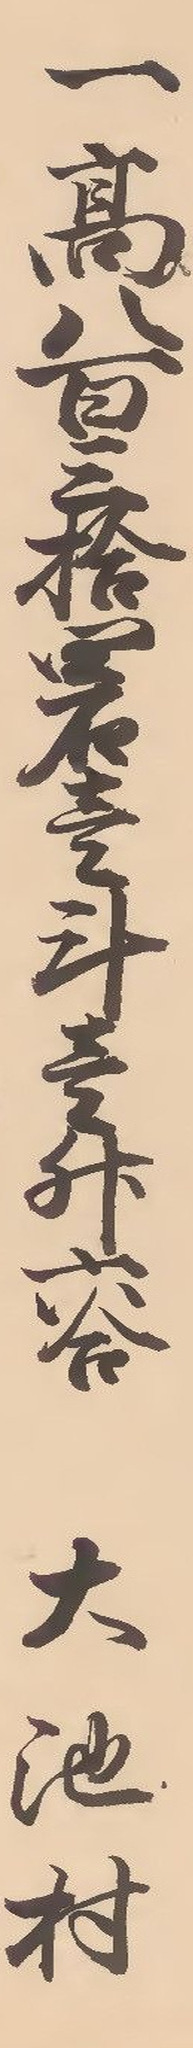一高八百三拾四石壱斗壱升六合大池村
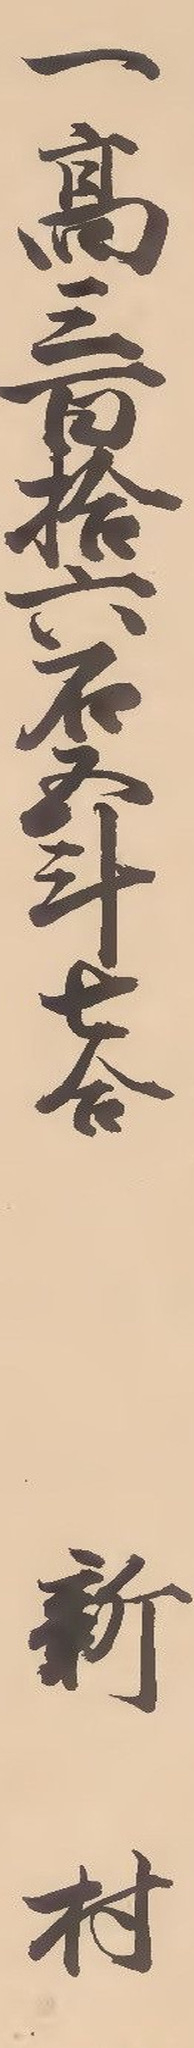一高三百拾六石五斗七合新村
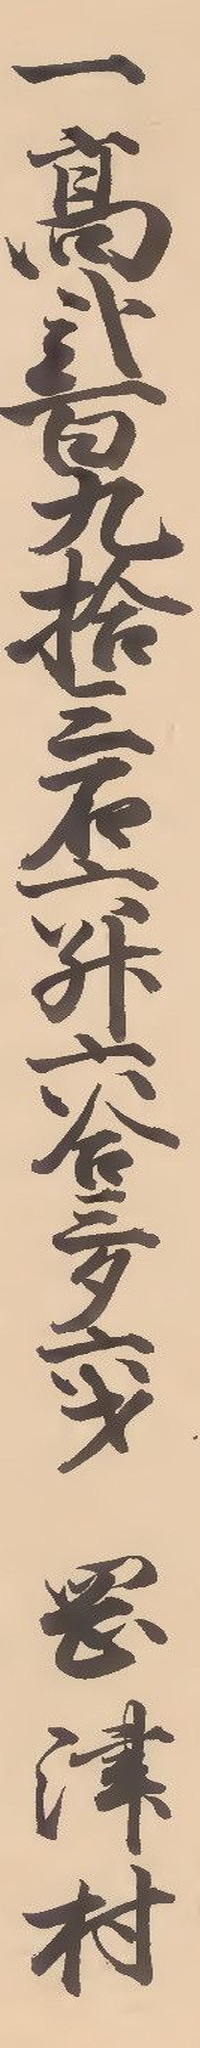一高弐百九拾三石六升六合三勺六才岡津村
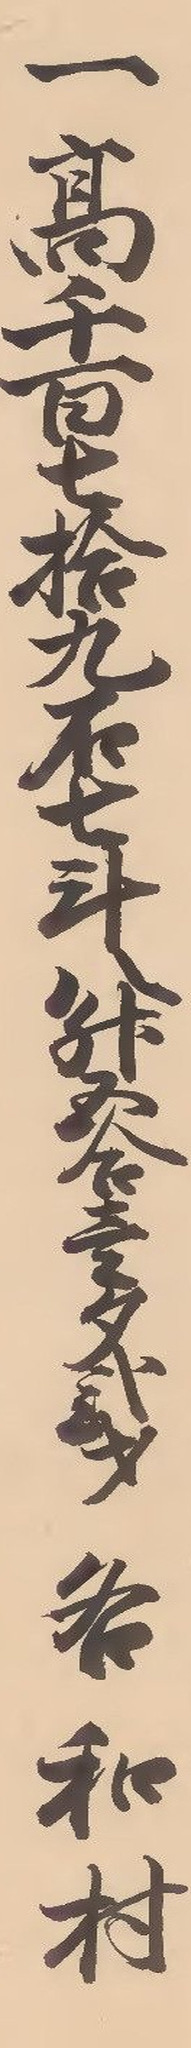一高千百七拾九石七斗八升五合壱勺弐才各和村

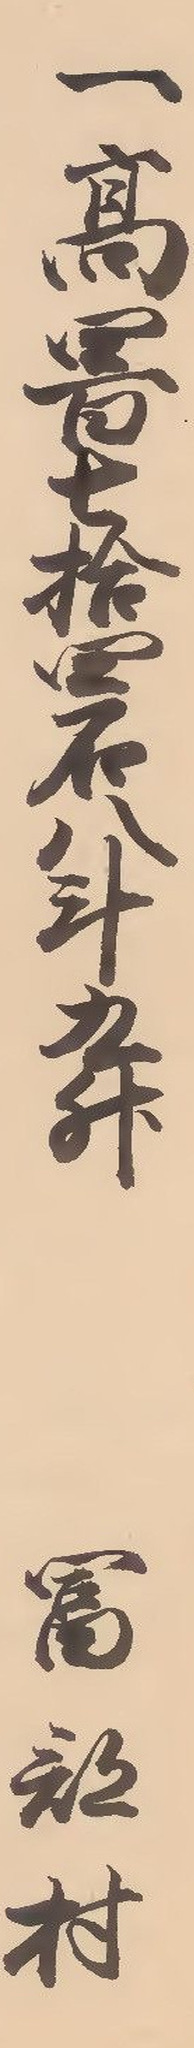一高四百七拾四石八斗九升富部村
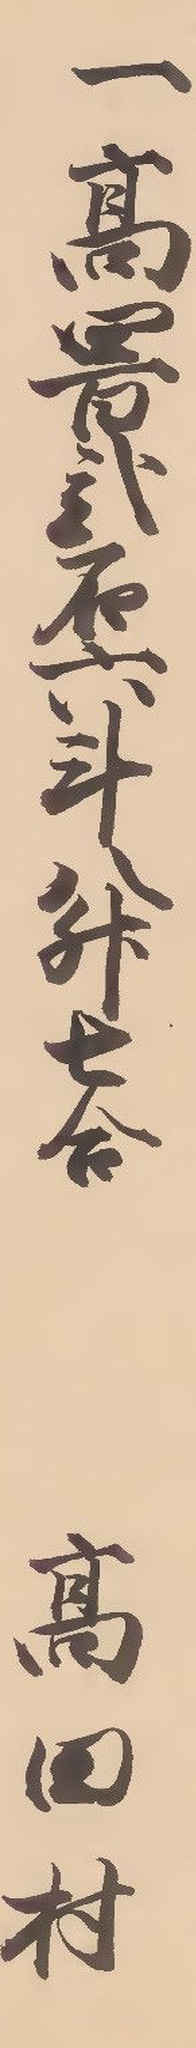一高四百弐石六斗八升七合高田村
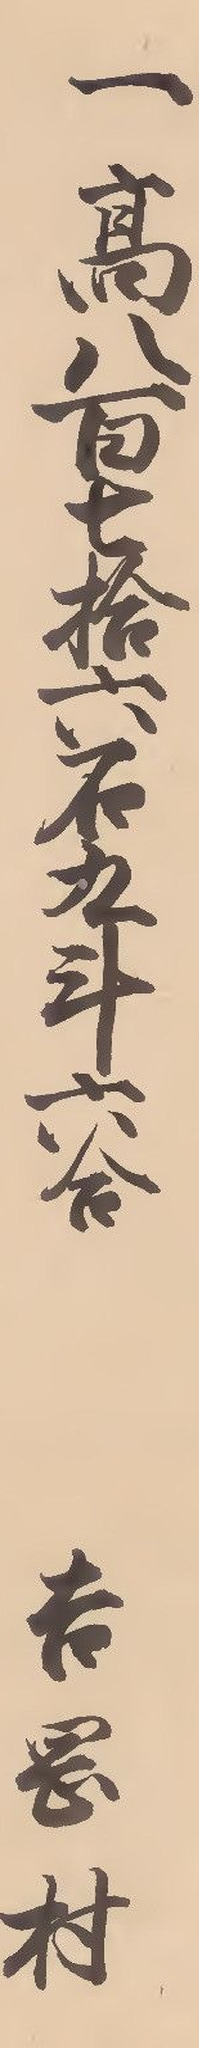一高八百七拾六石九斗六合吉岡村
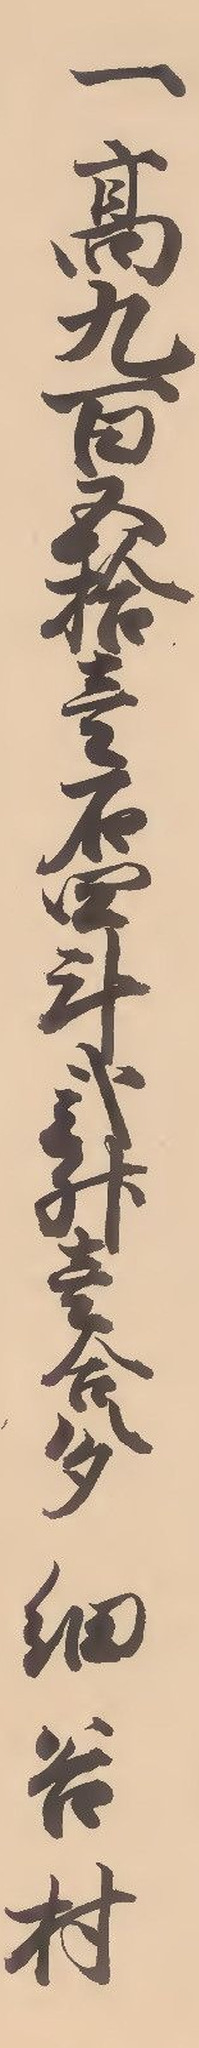一高九百五拾壱石四斗弐升壱合八勺細谷村
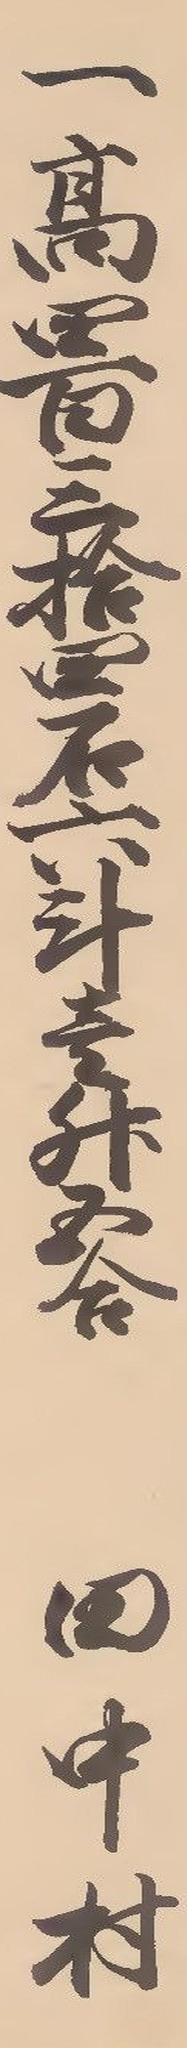一高四百三拾四石六斗壱升五合田中村
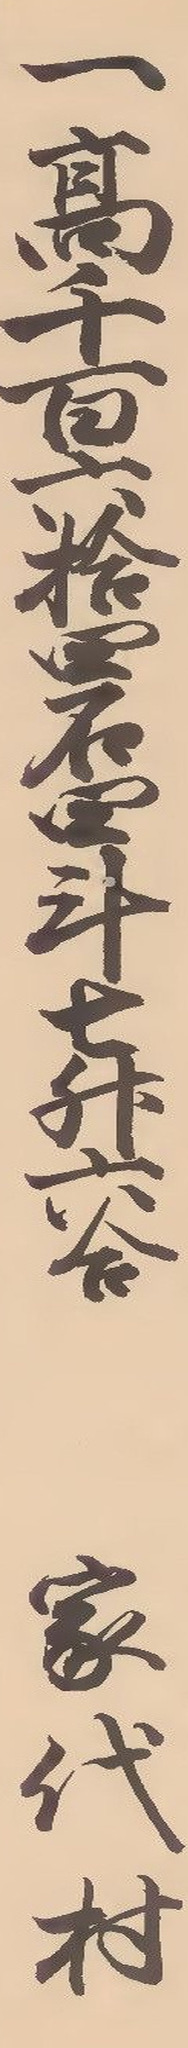一高千百六拾四石四斗七升六合家代村
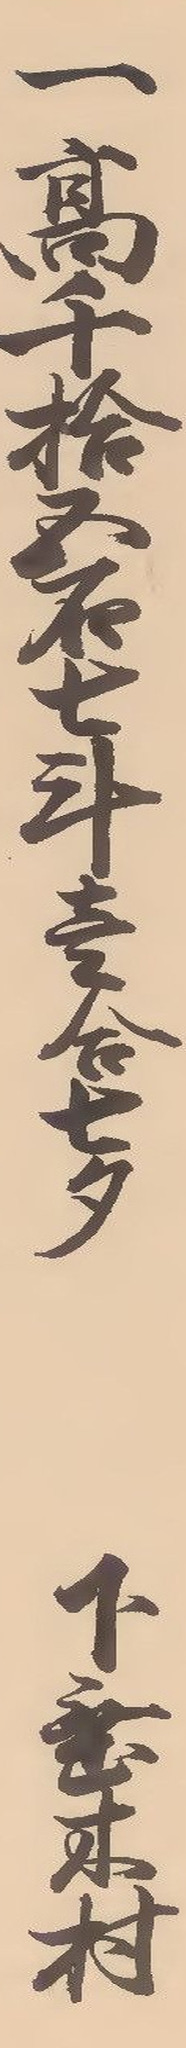一高千拾五石七斗壱合七勺下垂木村
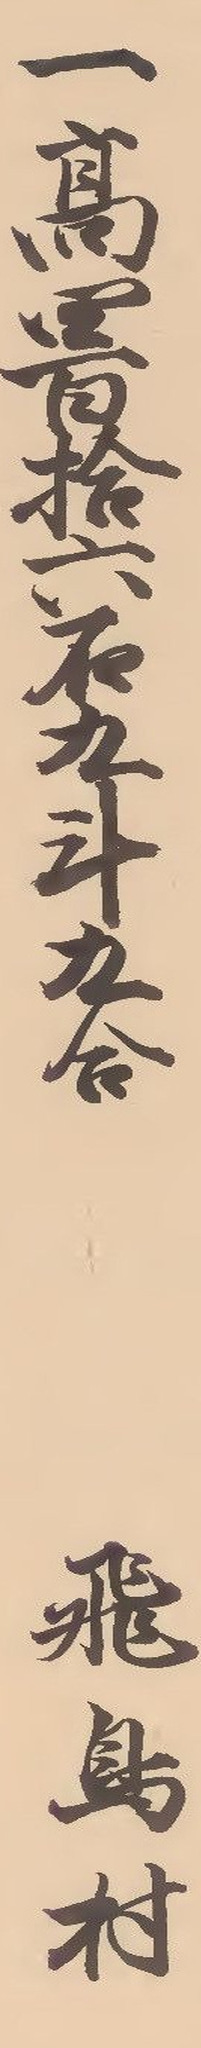一高四百拾六石九斗九合飛鳥村
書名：遠江国郷帳
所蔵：国立公文書館 National Archives of Japan
